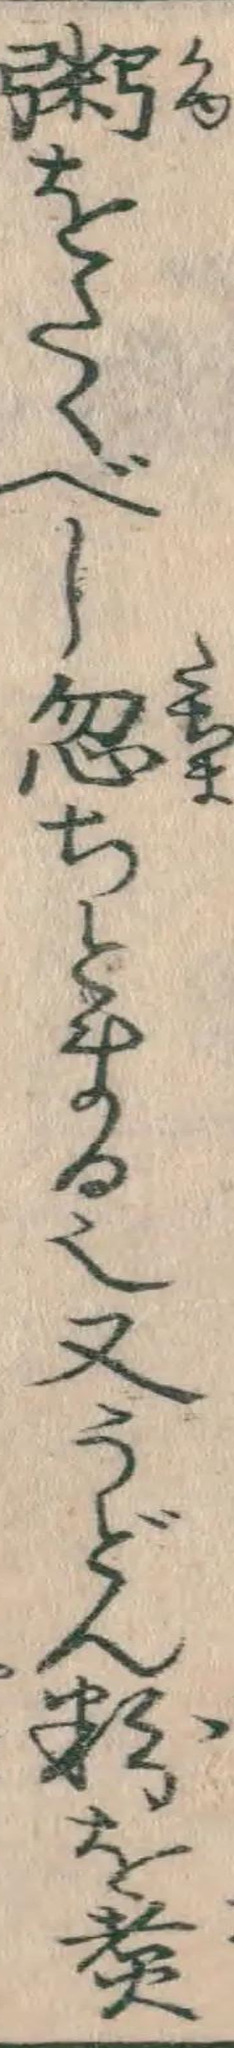粥をたくべし忽ちとまる也又うどん粉を煮
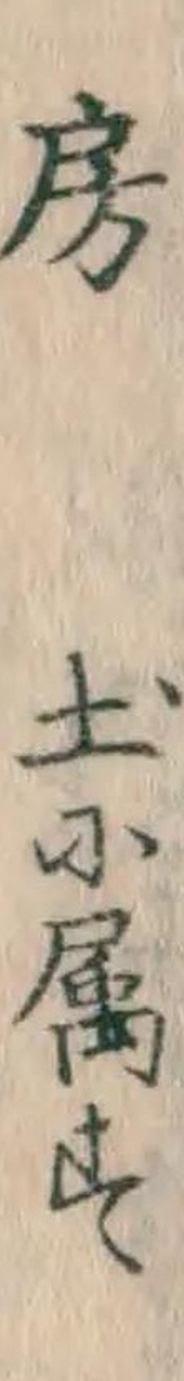房土に属す
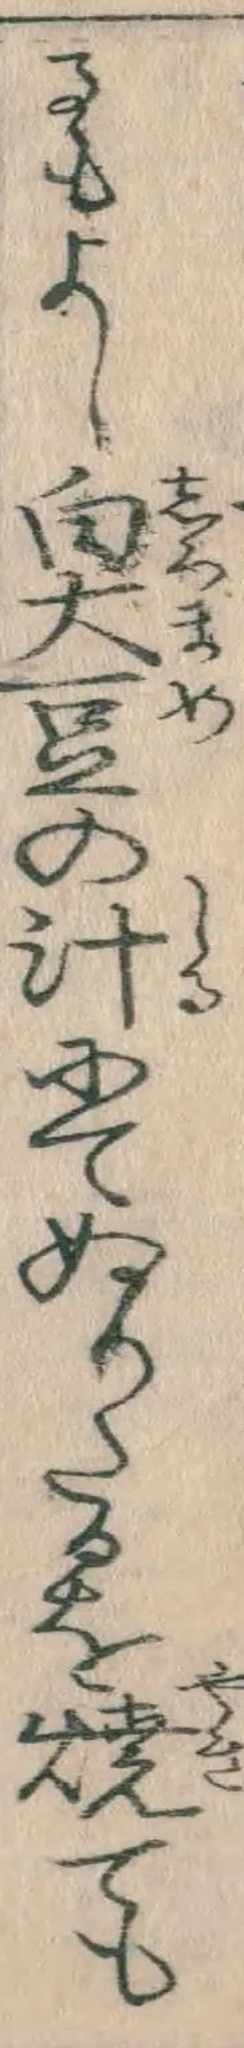るもよし白大豆の汁にてぬりたるを焼ても
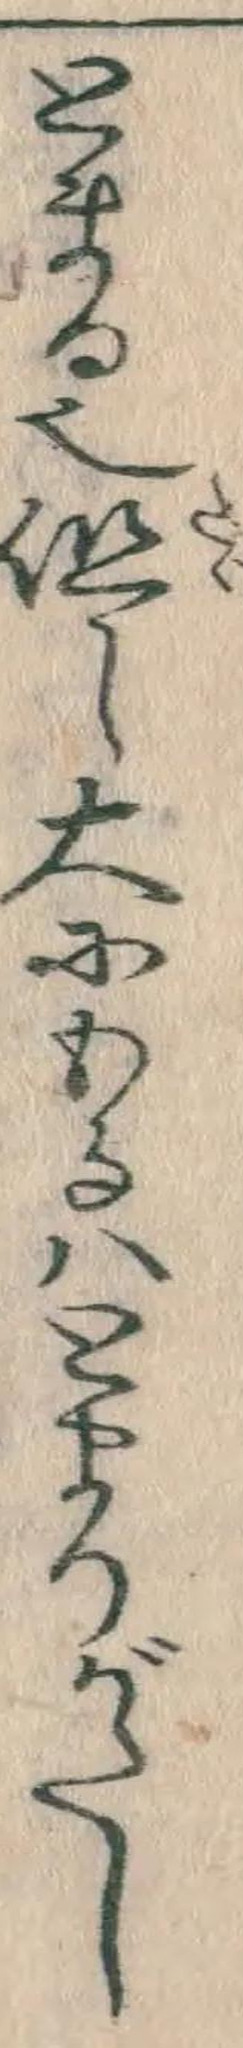とまる也但し大にもるはとまりがたし
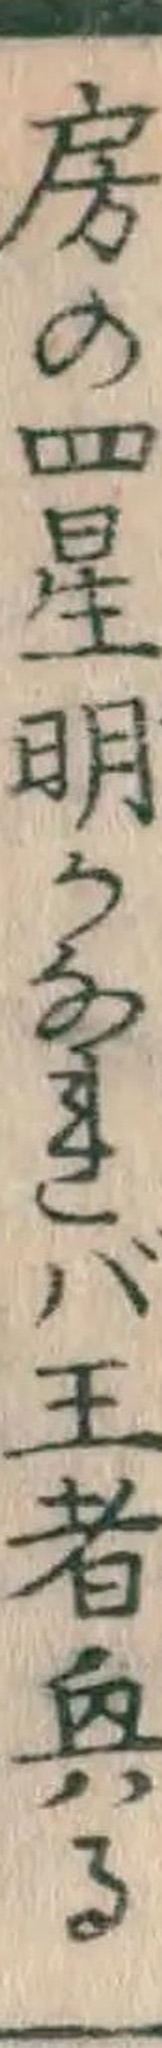房の四星明かなれば王者興る
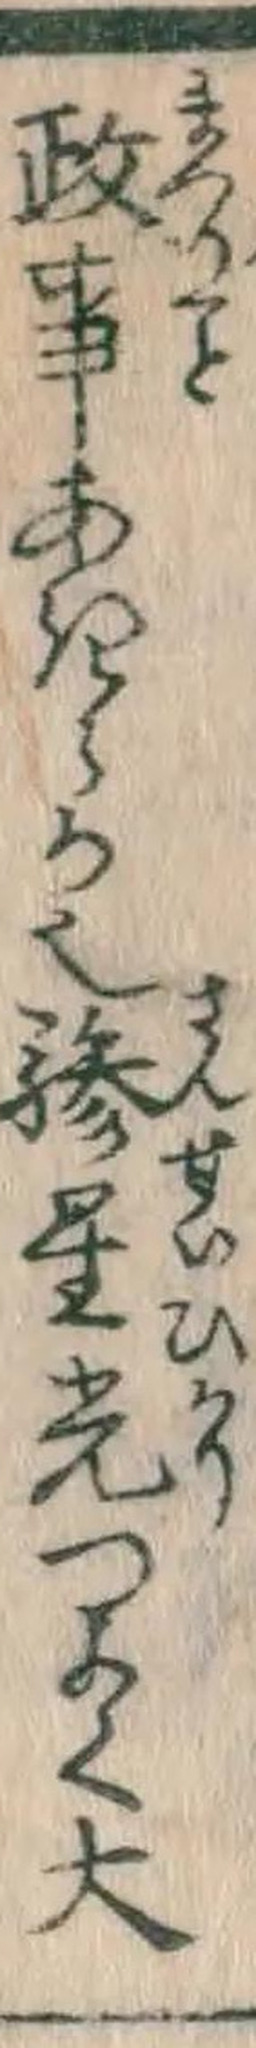政事あきらか也驂星光つよく大
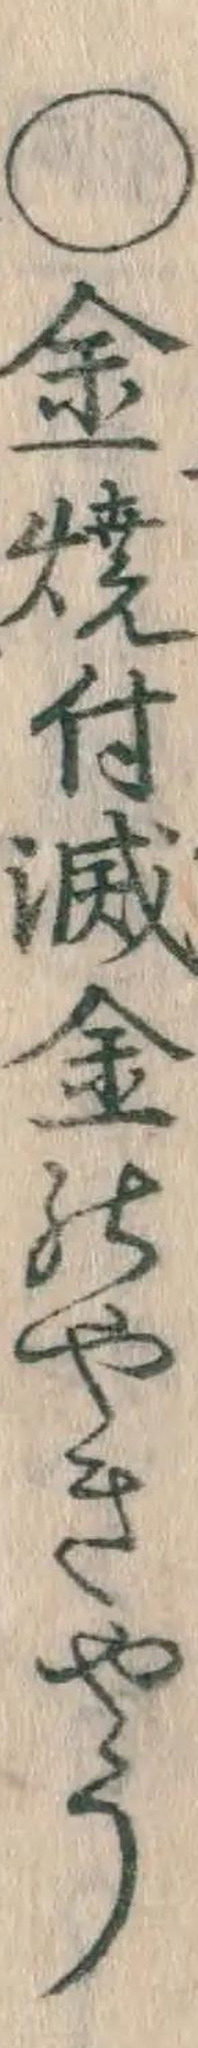○金焼付滅金のやきやう
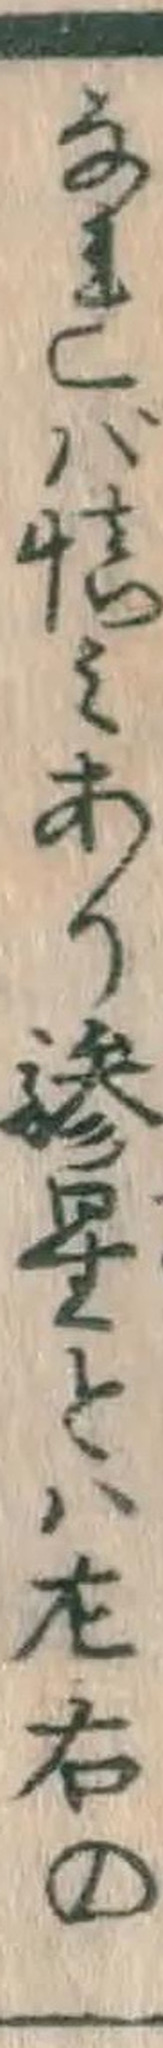なれば慎みあり驂星とは左右の
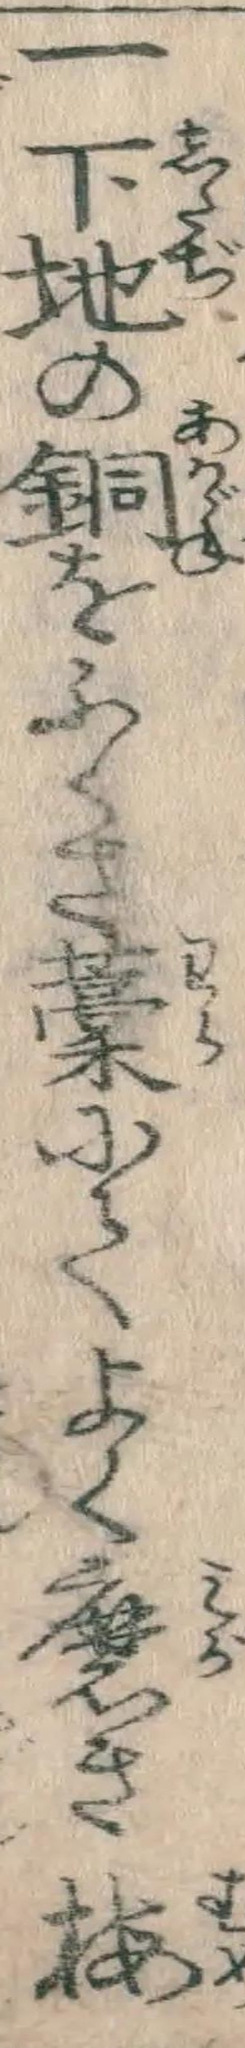一下地の銅をふくさ藁にてよく磨き梅
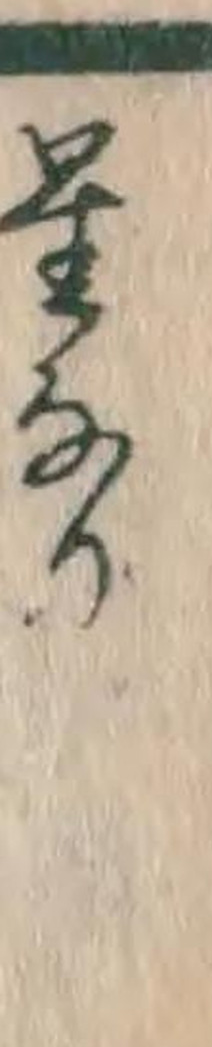星なり
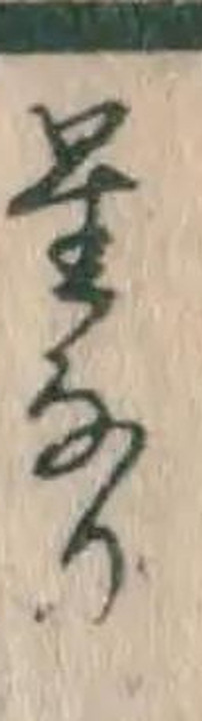星なり
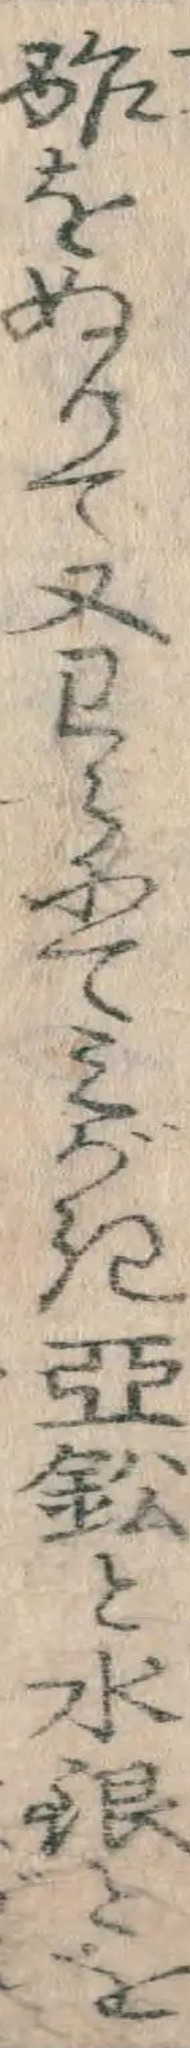酢をぬりて又わらにてみがき亜鉛と水銀とを
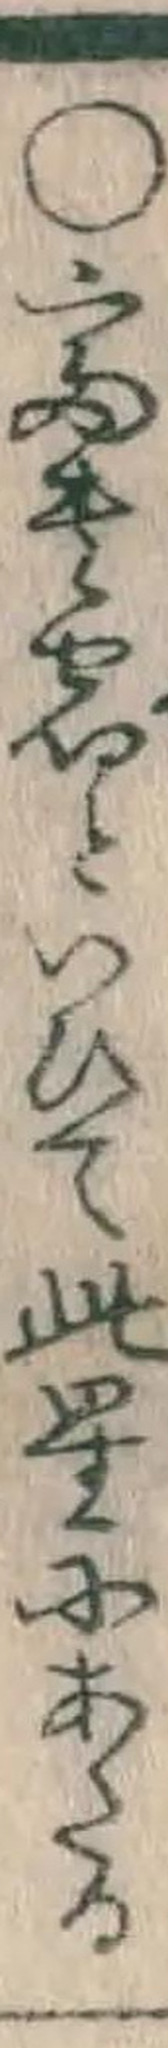○富貴宿といひて此星にあたる
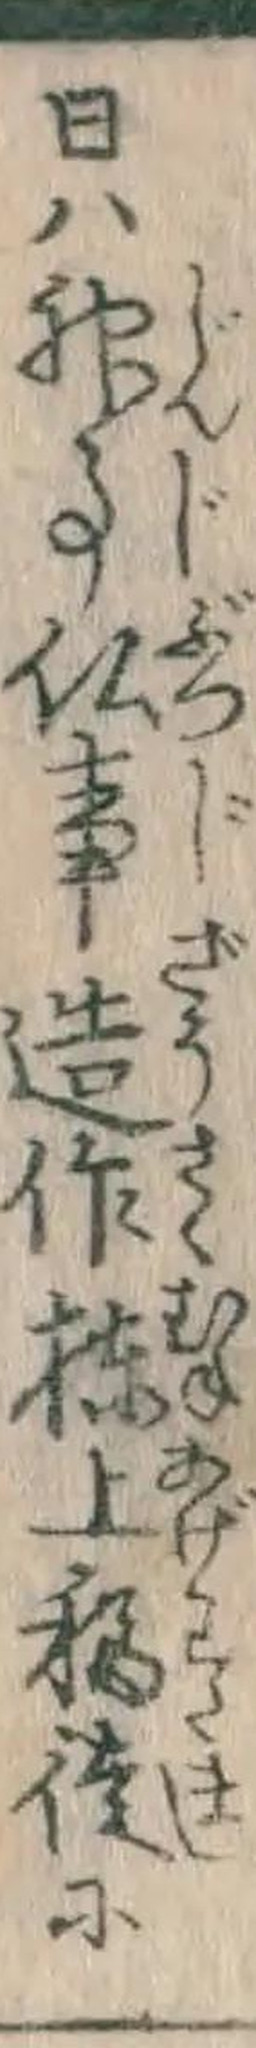日は神事仏事造作棟上移徒に
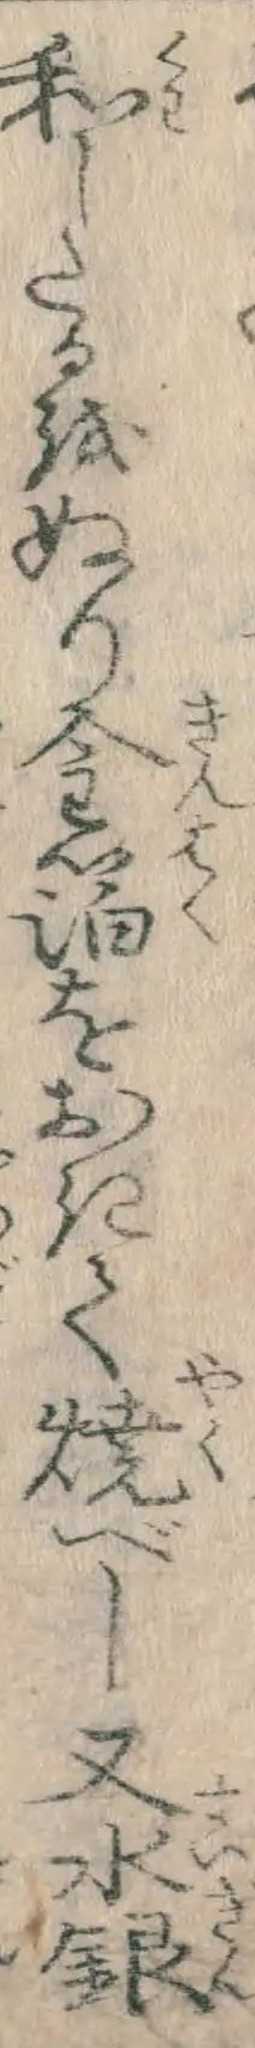和したるをぬり金箔をおきて焼べし又水銀
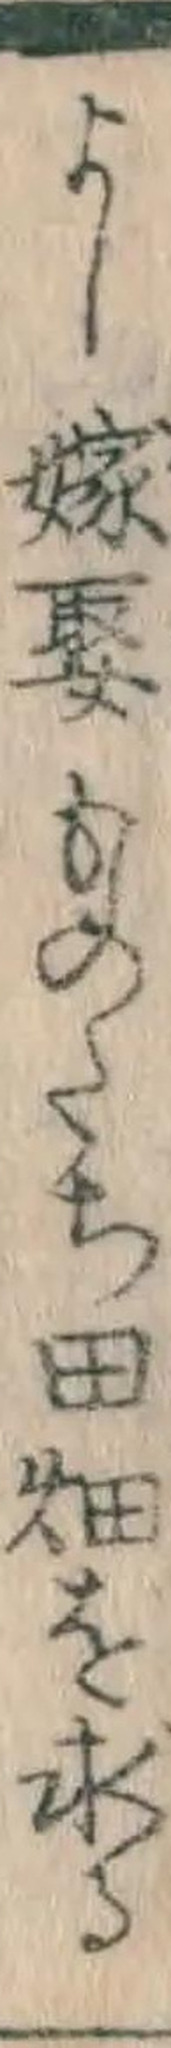よし嫁娶ものたち田畑を求る
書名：広益秘事大全 3巻. [2]
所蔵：国立国会図書館 National Diet Library, JAPAN
